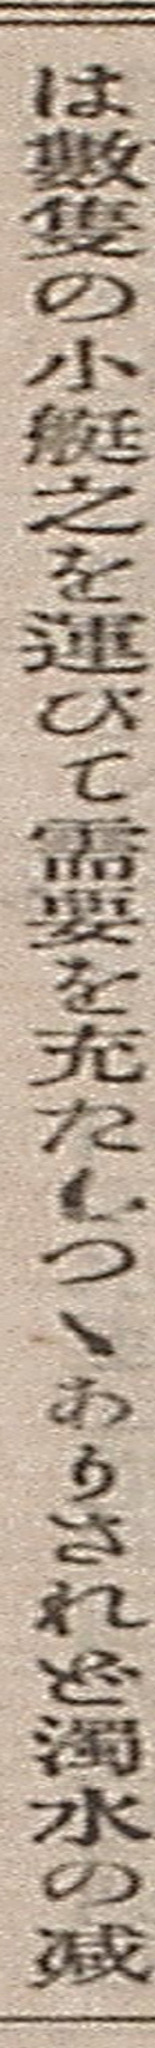は数隻の小艇之を運びて需要を充たしつゝありされど濁水の減
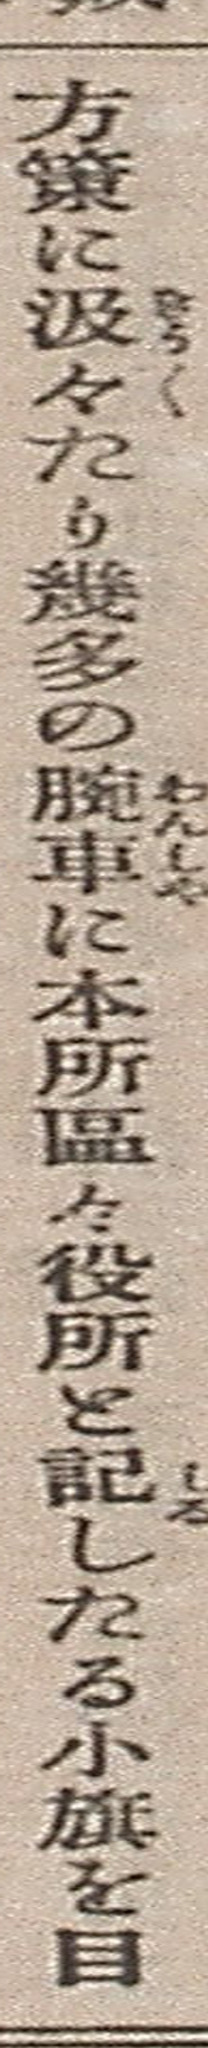方策に汲々たり幾多の腕車に本所区々役所と記したる小旗を目
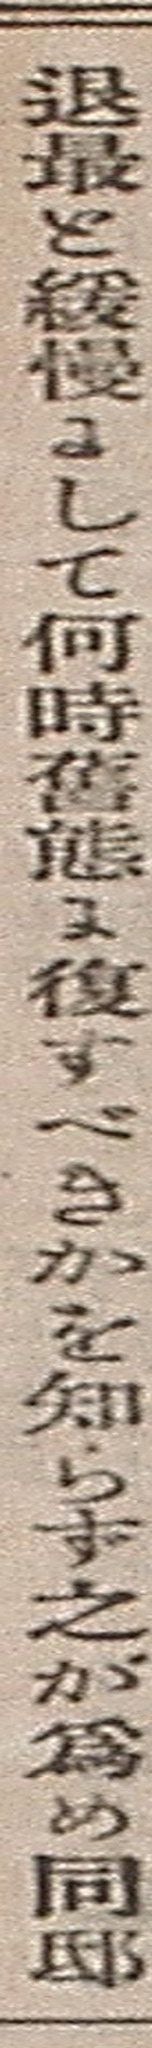退最と緩慢にして何時旧態に復すべきかを知らず之が為め同邸
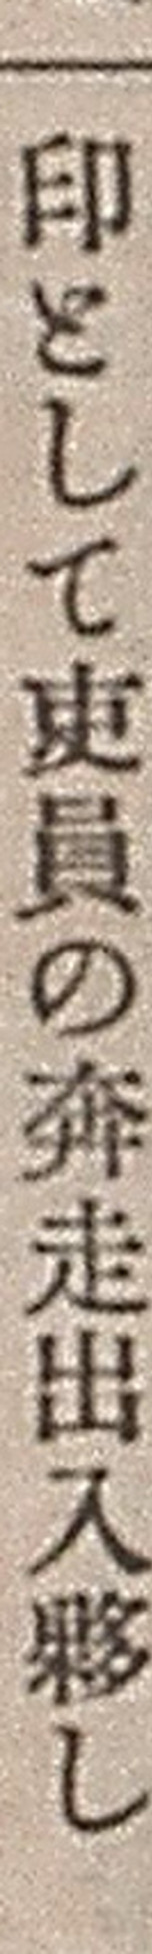印として吏員の奔走出入夥し
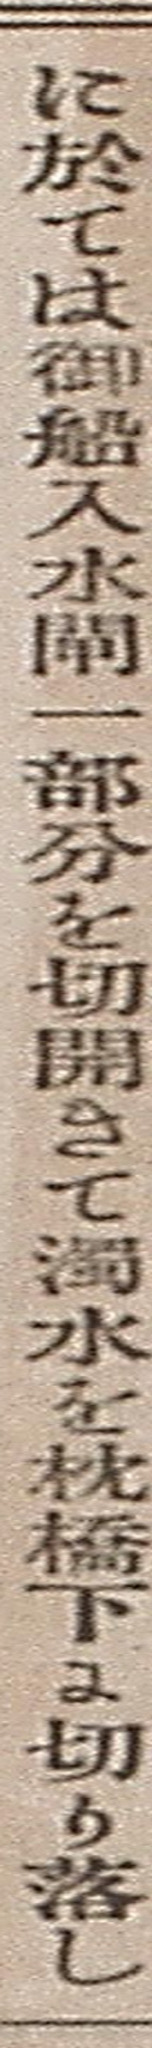に於ては御舟入水閘一部分を切開きて濁水を枕橋下に切り落し
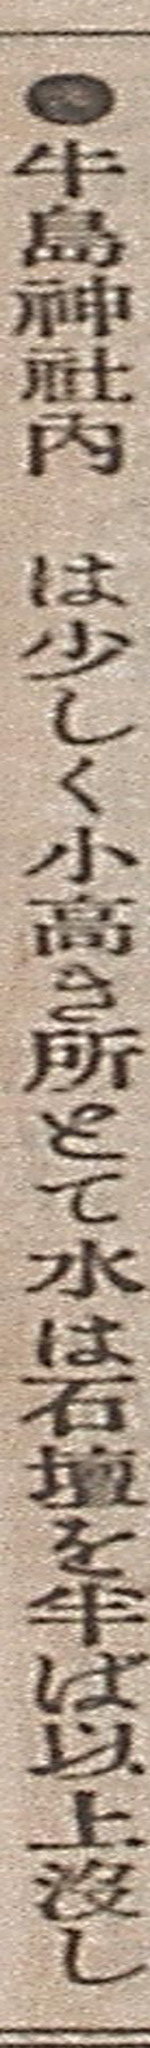●牛島神社内は少しく小高き所とて水は石壇を半ば以上没し
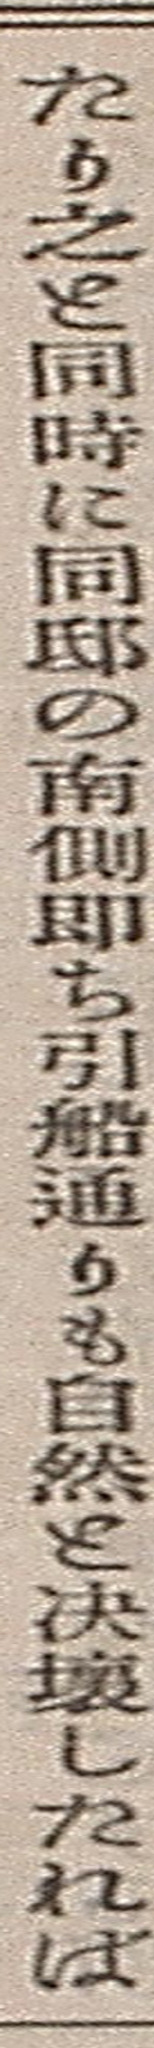たり之と同時に同邸の南側即ち引船通りも自然と決壊したれば
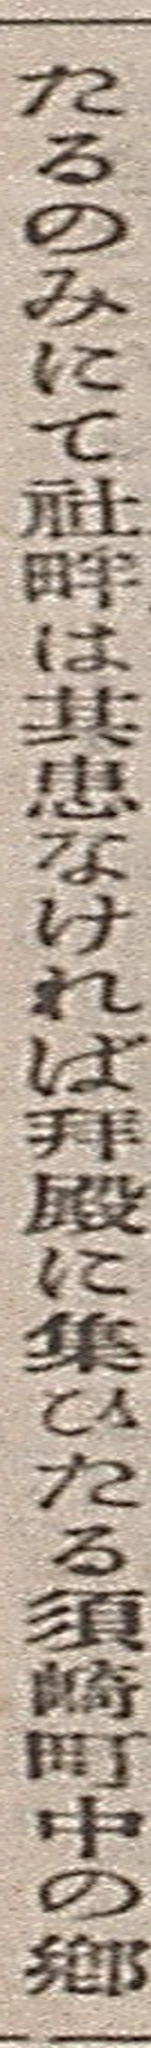たるのみにて社畔は其患なければ拝殿に集ひたる須崎町中の郷
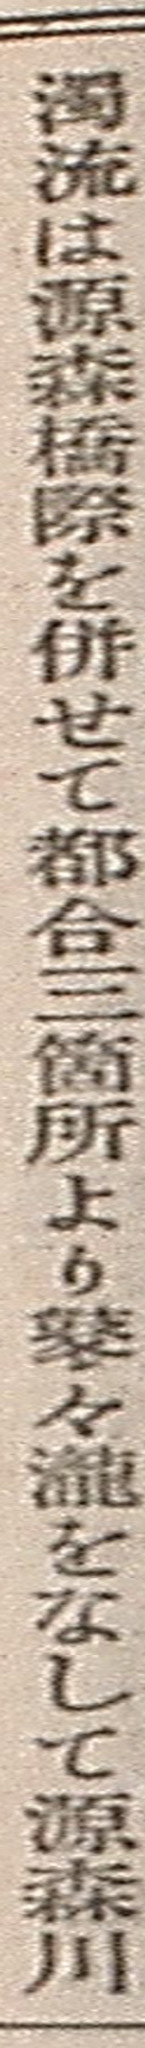濁流は源森橋際を併せて都合三箇所より鼕々瀧をなして源森川
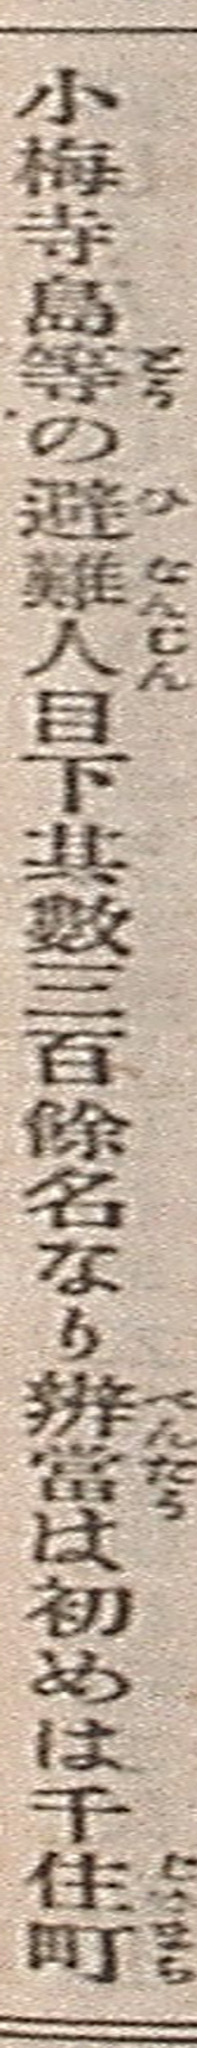小梅寺島等の避難人目下其数三百余名なり弁当は初めは千住町

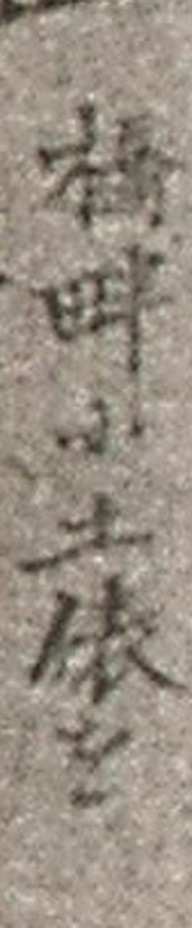橋畔に土俵を
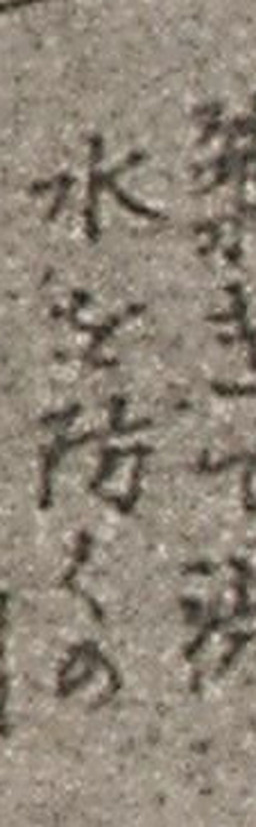水を防くの

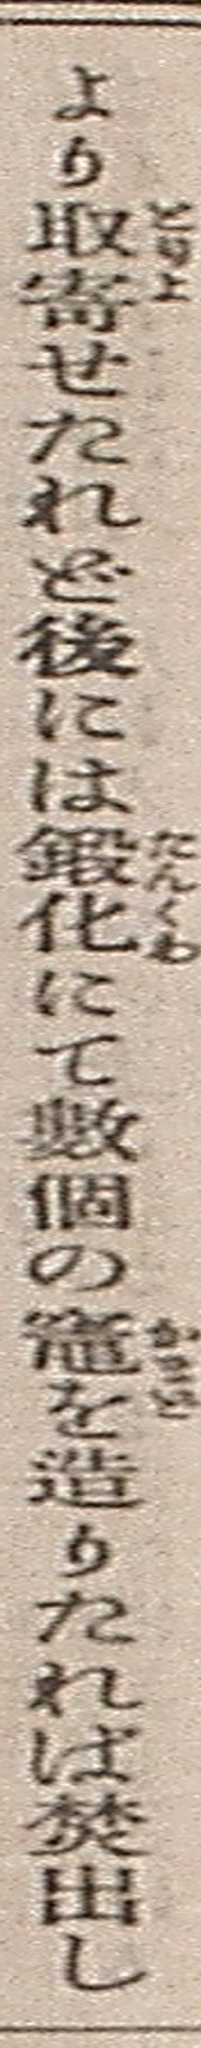より取寄せたれど後には鍛化にて数個の竃を造りたれば焚出し
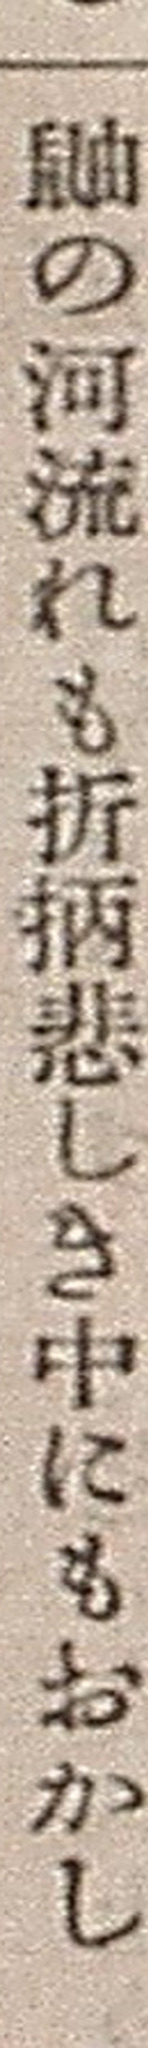鼬の河流れも折柄悲しき中にもおかし
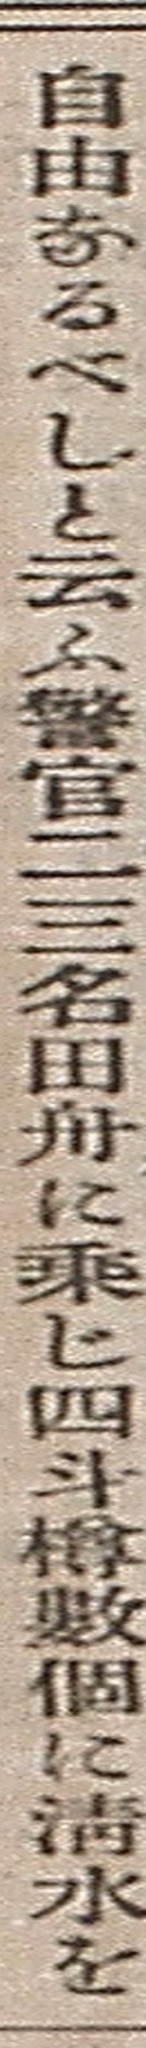自由なるべしと云ふ警官二三名田舟に乗じ四斗樽数個に清水を
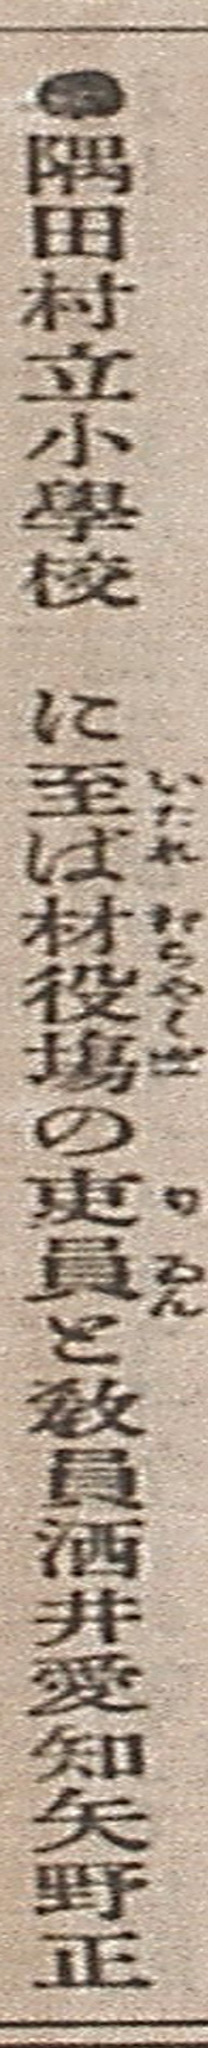●隅田村立小学校に至ば村役場の吏員と教員酒井愛知矢野正
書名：風俗畫報臨時増刊第百二十四號　洪水地震被害録（上）
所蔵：東京大学地震研究所図書室 Earthquake Research Institute Library, The University of Tokyo, JAPAN
